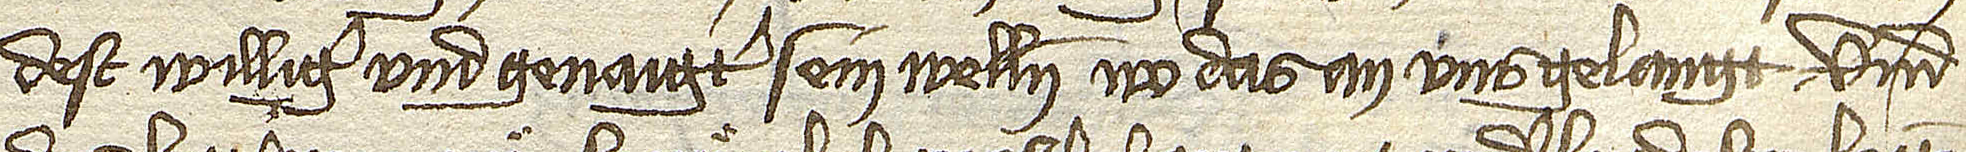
deſt willig* vnd genaigt* ſein welln* wo das an vns gelangtt / Vnd
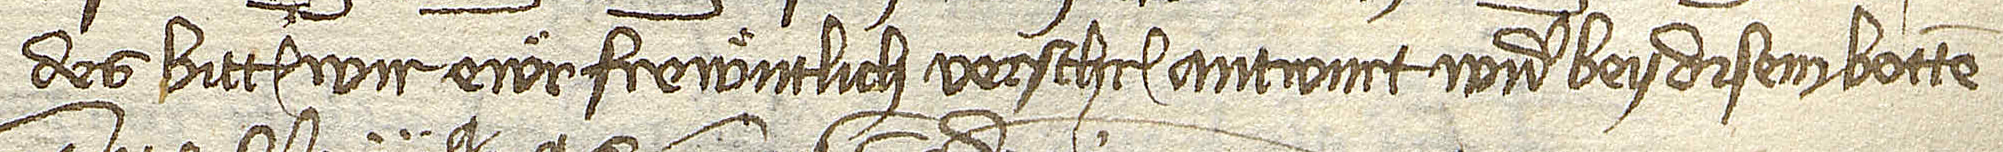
des bitt* wir eẅr freẅntlich verſchr* antwurt wid* bey diſem botte*
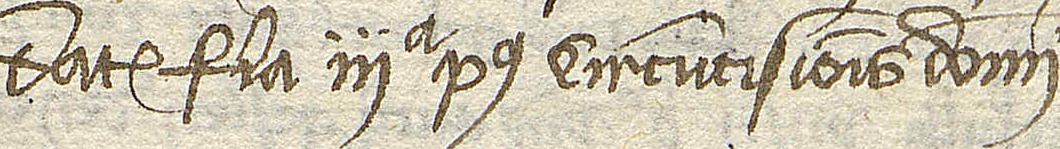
Dat* fi*a iii* p* Circu*ciſio*is domi*
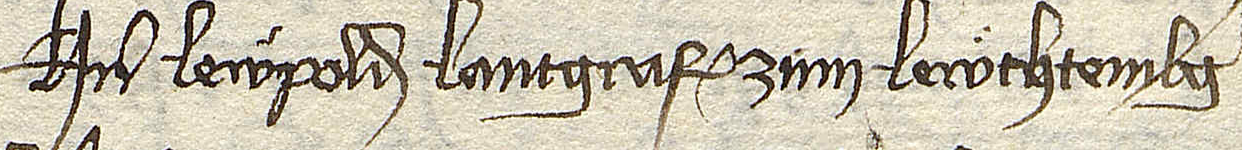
Hn* Leẅpold* Lantgraf* ʒum Leẅchtemb*g
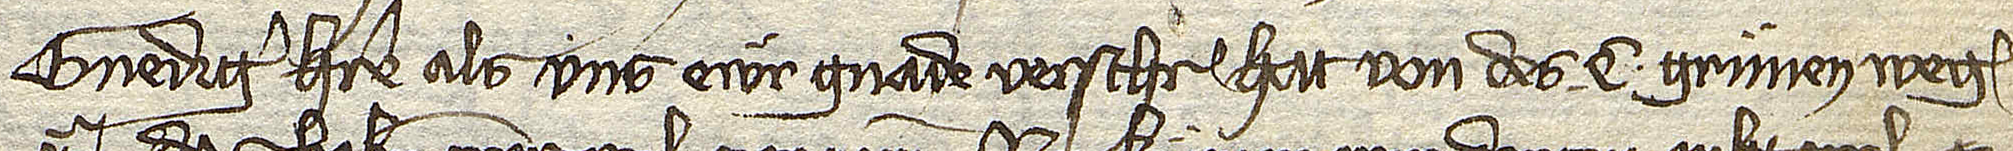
Gnedig* h*re als vns eẅr gnade verſchr* hat von des C* . grünen weg*
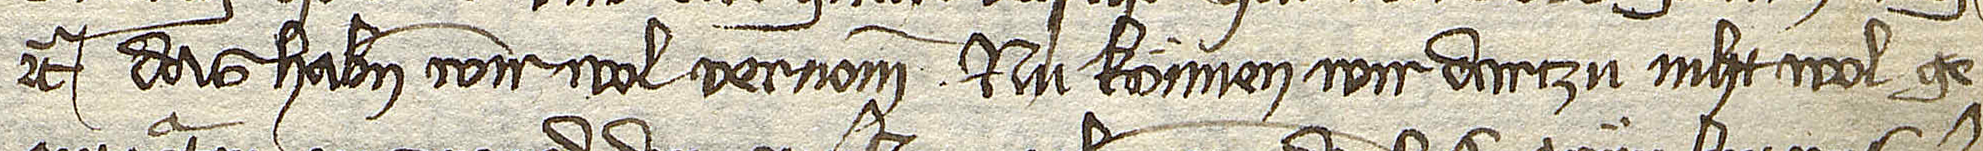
ec* Das habn* wir wol vernom* . Nu können wir darcʒu niht wol ge
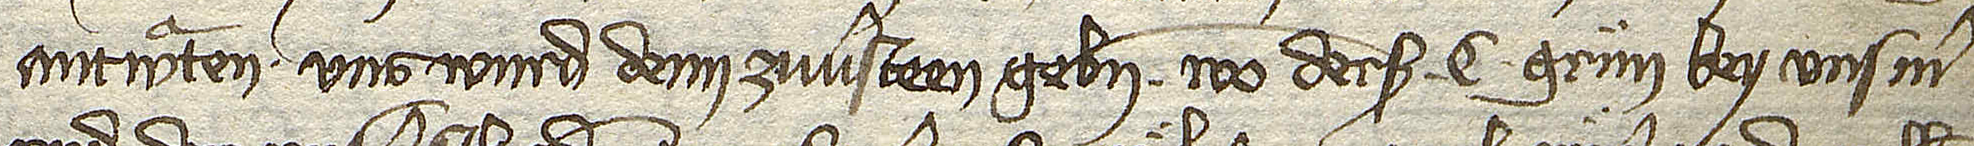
antw*ten . vns wurd* denn ʒuu*ſteen gebn* . wo derſ* . C* . grün bey vnſm*
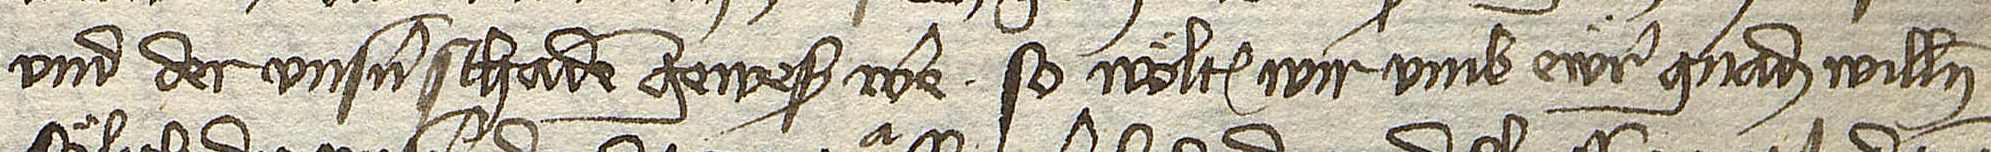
vnd der vnſn* ſchade* geweſ* w*e . ſo wölt* wir vmb eẅr* gnad* willn*
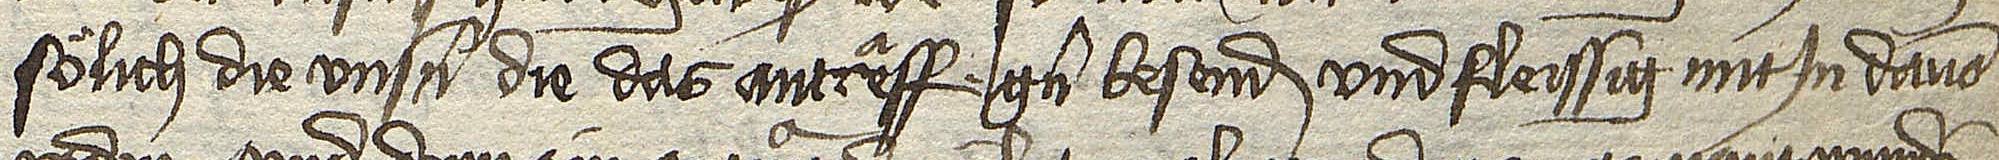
ſölich die vnſn* die das antrëff . g*n beſend* vnd fleiſſig mit In dauo*
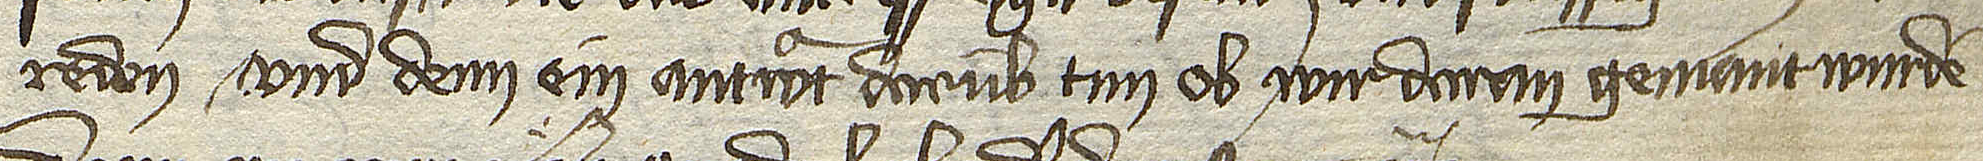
reden / vnd denn ein antw*t darub* tun ob wir daran gemant wurde*
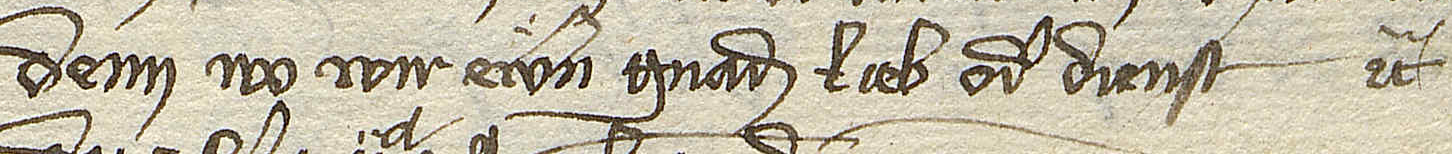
Denn wo wir eẅ*n gnad* lieb od* dienſt ec*
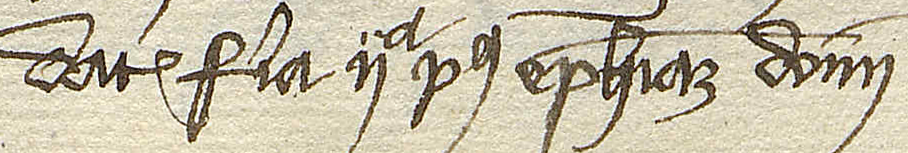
Dat* fi*a ii* p* eph*ia* domi*
